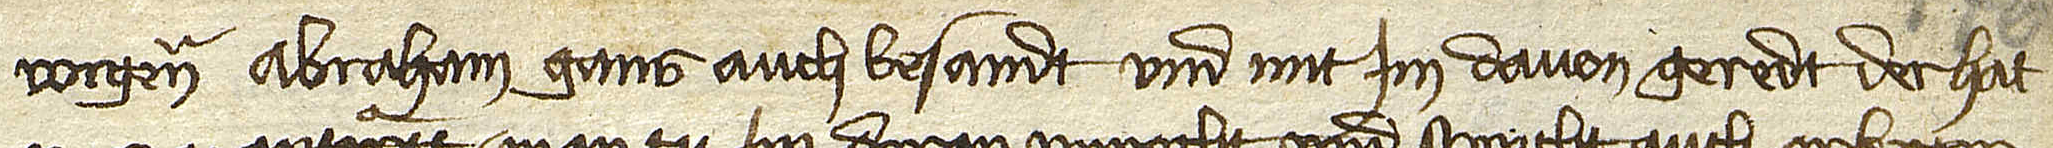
vorgen* abraham gans auch beſandt vnd mit Im dauon geredt der hat
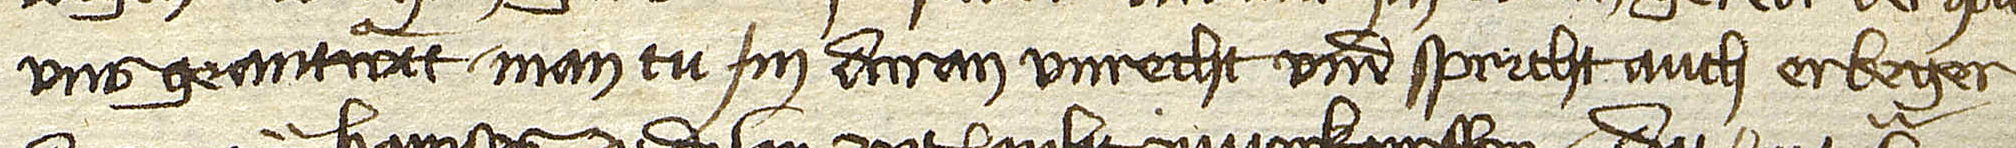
vns geantw*tt / man tu Im daran vnrecht vnd ſpricht auch erbeger
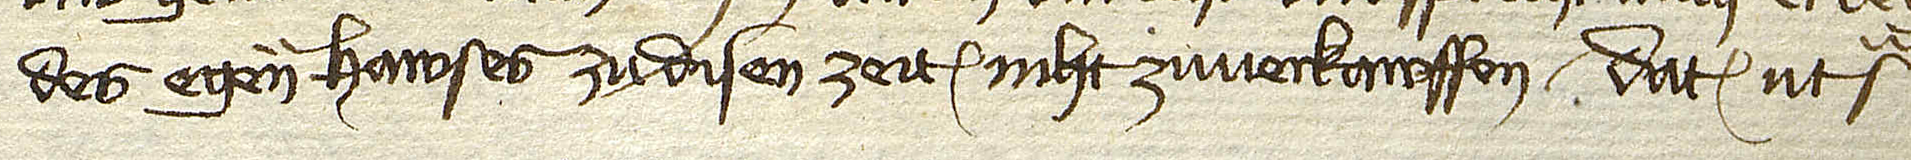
des egen* hawſes ʒu diſen ʒeit* niht ʒuuerkawffen / Dat* ut ſ*
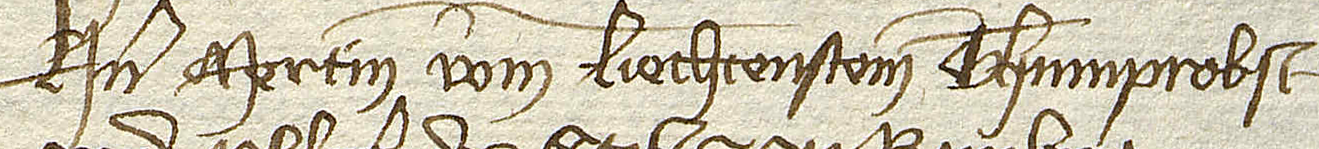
H*n Mertin vom Liechtenſtein Thumprobſt
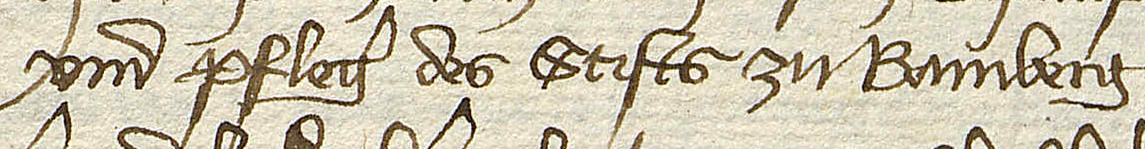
vnd Pfleg* des Stifts ʒu Bamberg
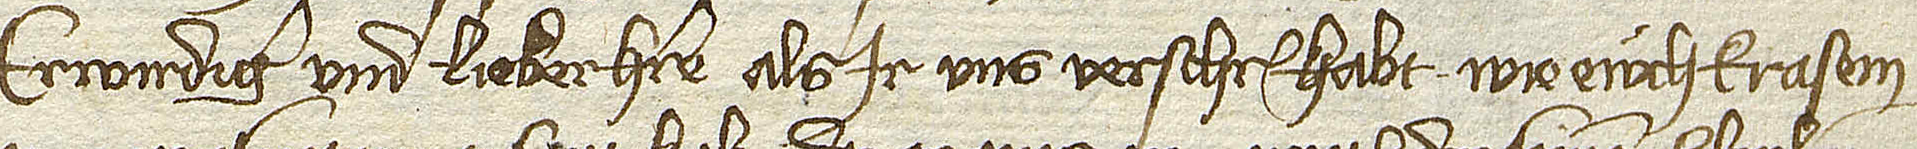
Erwirdig* vnd lieber h*re als Ir vns verſchr* habt . wie ewch Eraſem
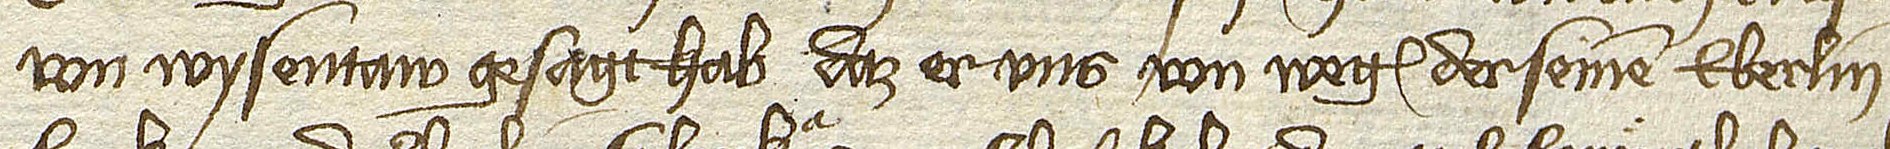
von wyſentaw geſagt habe daʒ er vns von weg* der ſeine* Eberlin
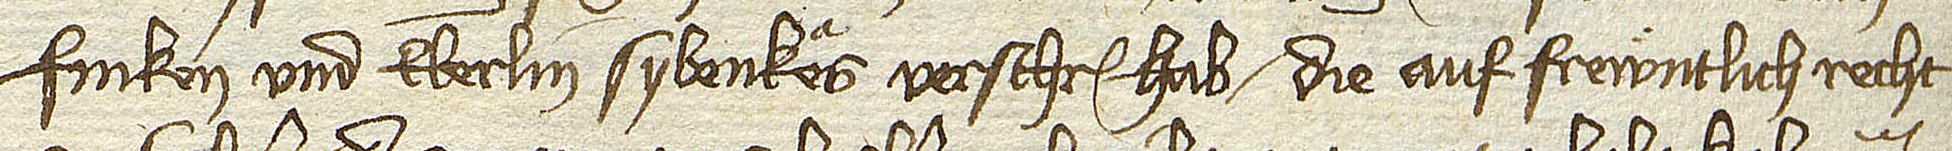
finken vnd Eberlin ſybenkës verſchr* hab / die auf frewntlich recht
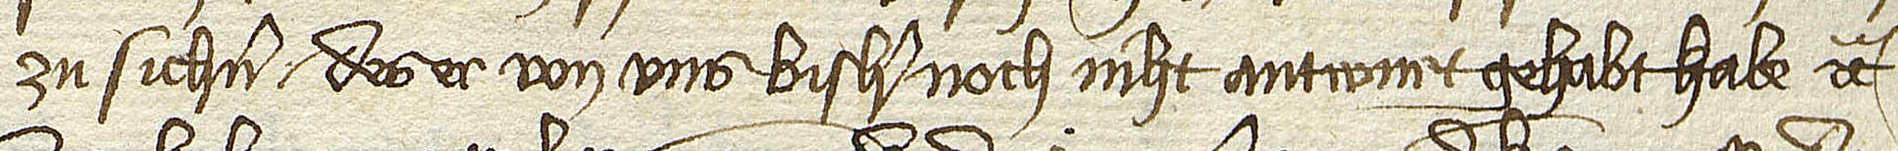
ʒu ſich*n . / Des er von vns biſh* noch niht antwurt gehabt habe ec*
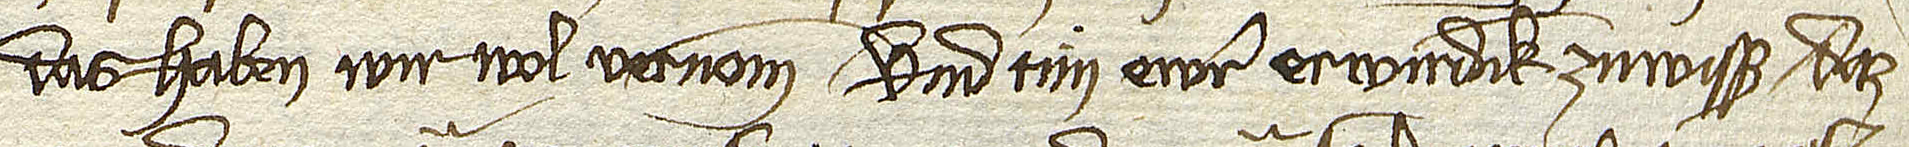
Das haben wir wol vernom* / Vnd tün ew*r erwirdik* ʒuwiſſ* / daʒ
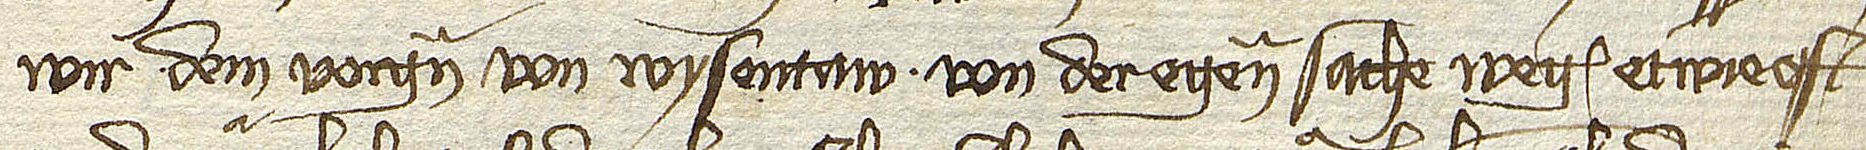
wir dem vorgn* von wyſentaw . von der egen* ſache weg* etwieoft
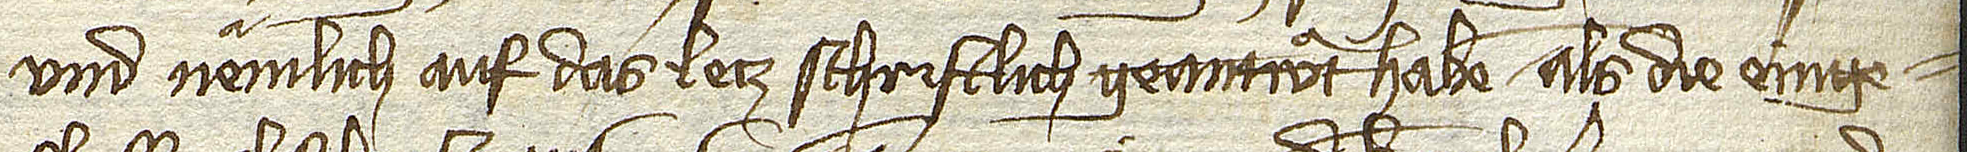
vnd nëmlich auf das lecʒ ſchriftlich geantw*t habe* / als die einge =
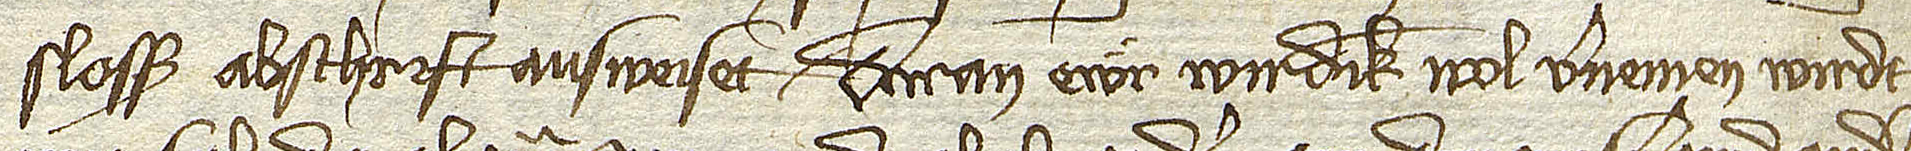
ſloſſ* abſchrift aufweiſet / Daran ewr wirdik* wol v*nemen wirdt
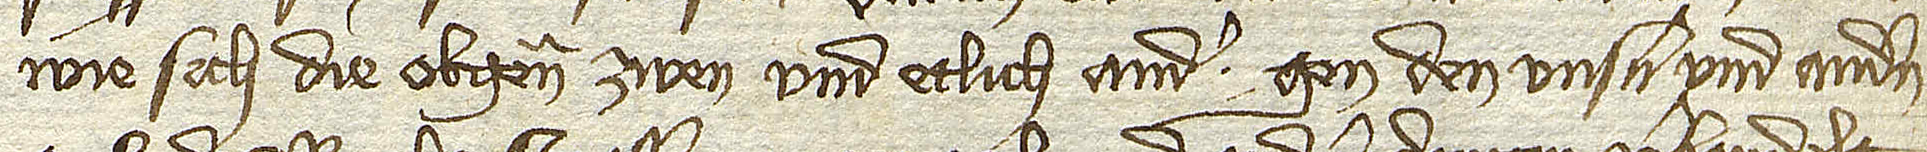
wie ſich die obgen* ʒwen vnd etlich and* . gen den vnſ*n vnd and*n
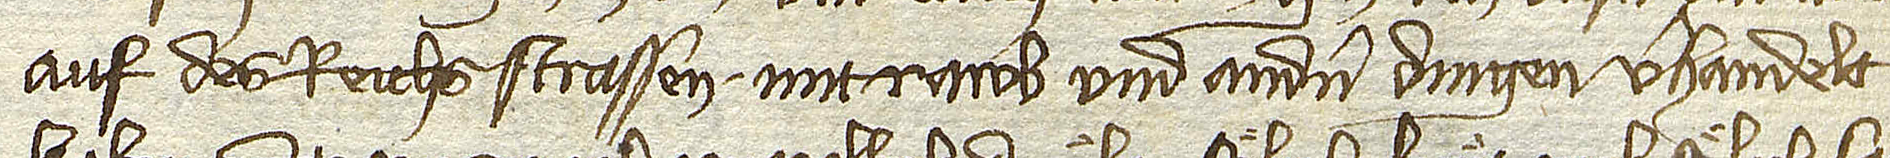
auf des Reichs ſtraſſen . mit rawb vnd and*n dingen v*handelt
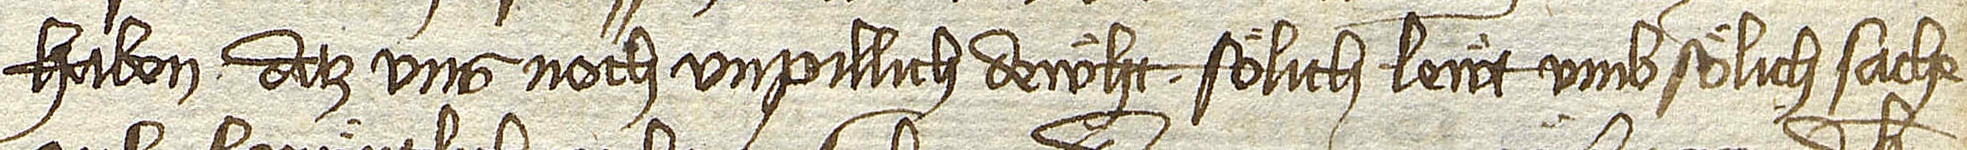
haben. daʒ vns noch vnpillich dewht . ſölich lewt vmb ſölich ſache
